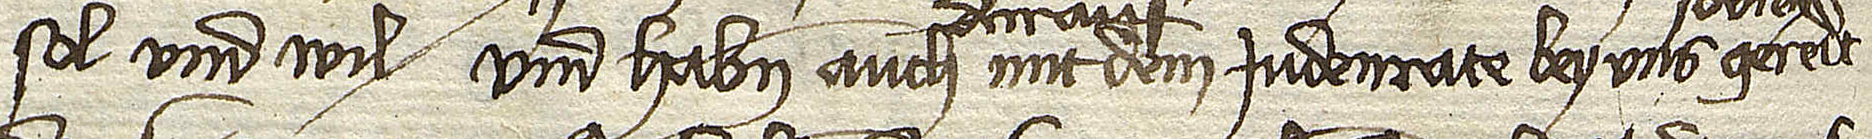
ſol vnd wil vnd habn* auch mit dem Iudenrate bey vns geredt
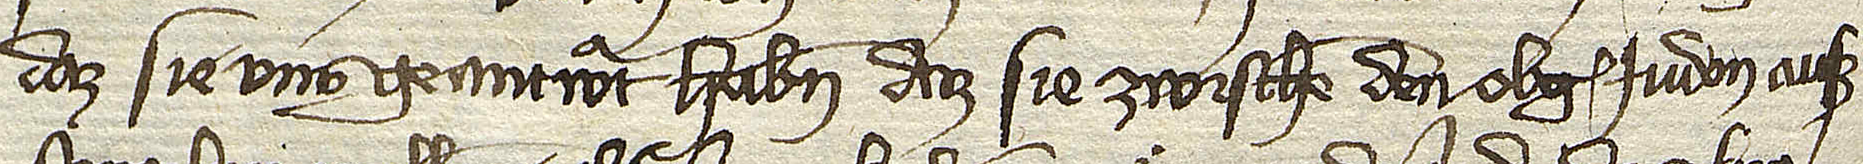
daʒ ſie vns geantw*t habn* daʒ ſie ʒwiſche* den obg* Iuden auſʒ
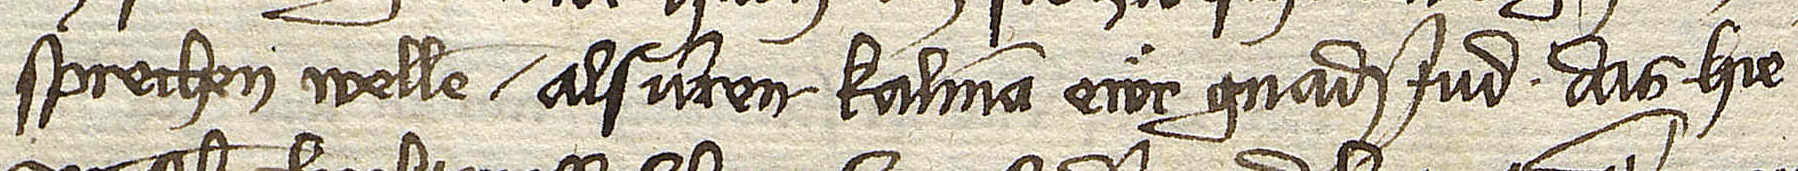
ſprechen welle* / alſu*ren kalma* eẅr gnad* Iude . das hie
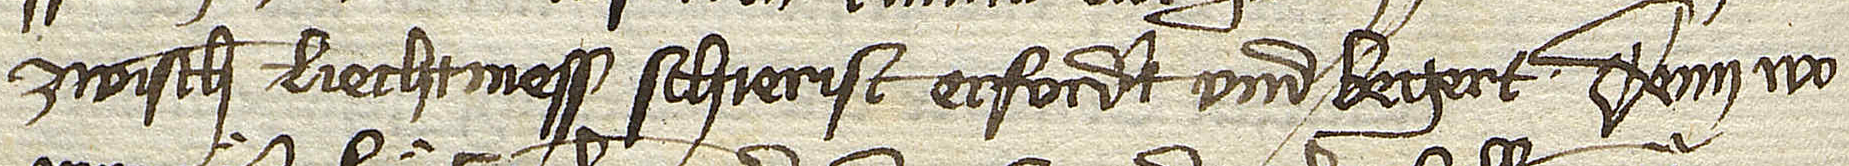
ʒwiſch* liechtmeſſ ſchieriſt erford*t vnd begert / Denn wo
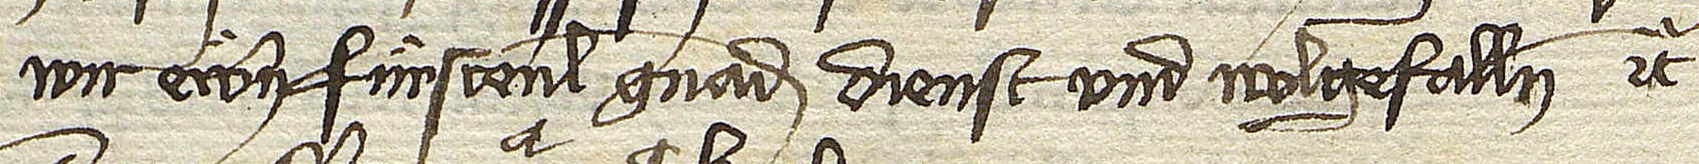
wir eẅ*n fürſtenl* gnad* dienſt vnd wolgefalln* ec*
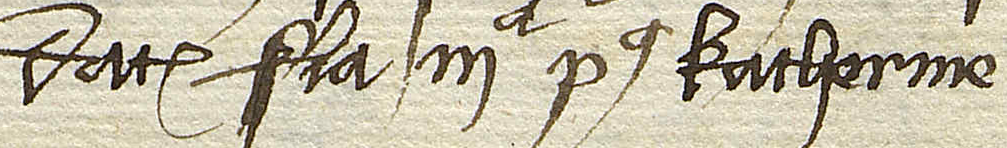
Dat* fi*a iii* p* katherine
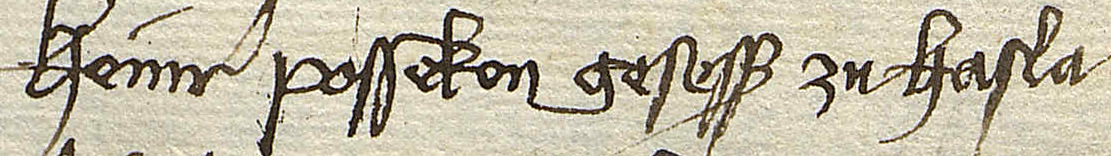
Heinr* Poſſekon geſeſſ* ʒu haſla
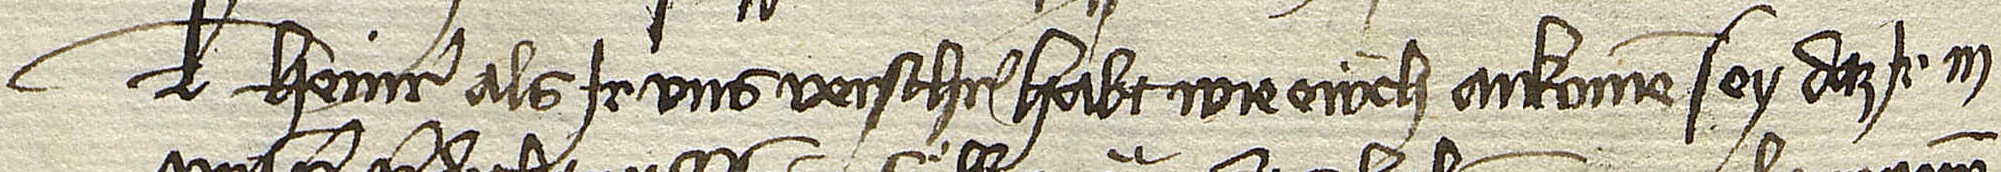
L* heinr* als Ir vns verſchr* habt wie eẅch ankome* ſey daʒ Ir in
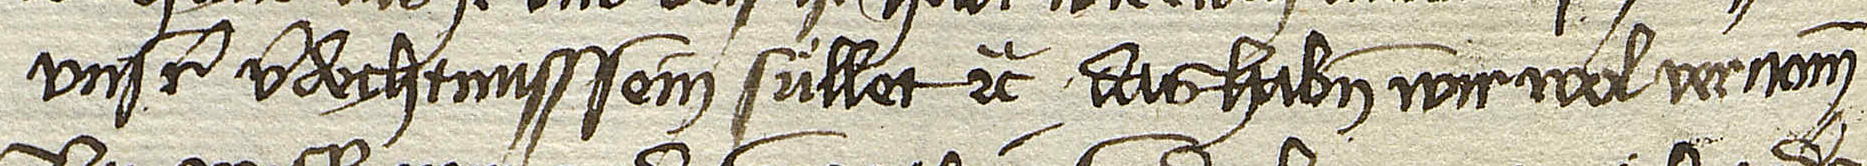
vnſr* v*dechtnuſſ ſein ſüllet ec* / das habn* wir wol vernom*
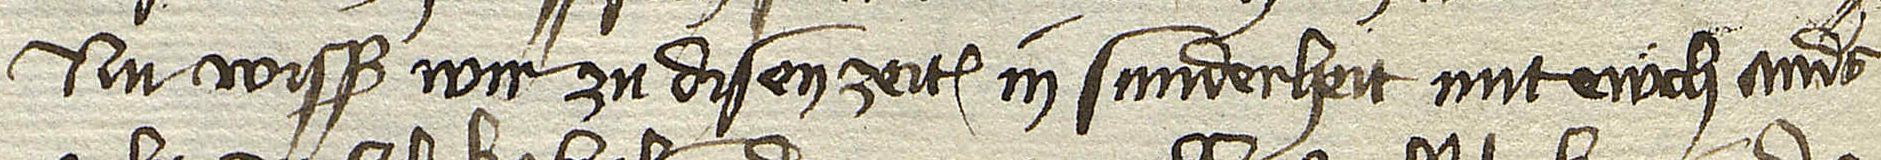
Nu wiſſ* wir ʒu diſen ʒeit* in ſunderheit mit eẅch and*s
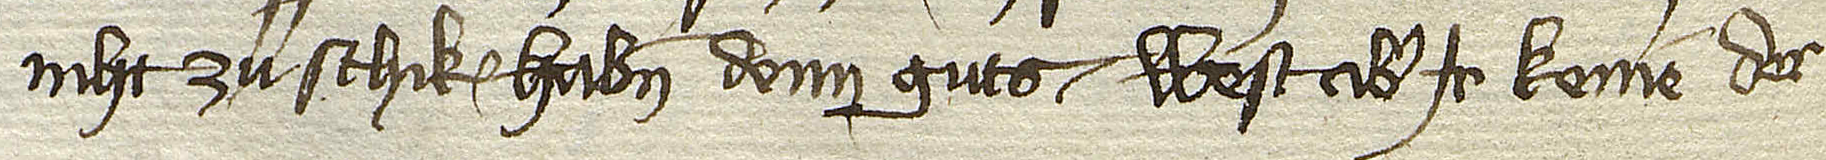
niht ʒu ſchik* habn* denn guts / Weſt ab* Ir keine* der
